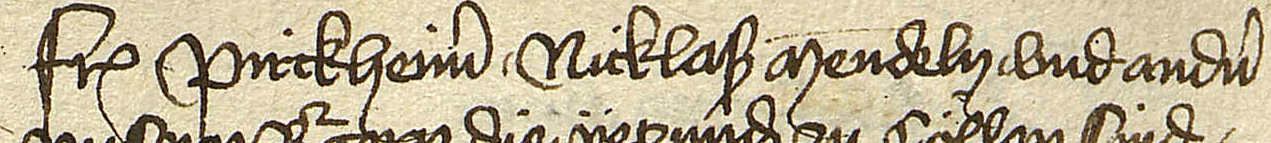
Fr* Pirckheim* / Nicklaſʒ Mendeln / vnd andn*
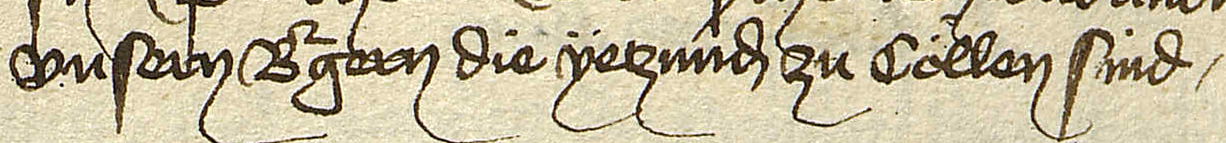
vnſern B*gern die yecʒund* cʒu Cöllen ſind /
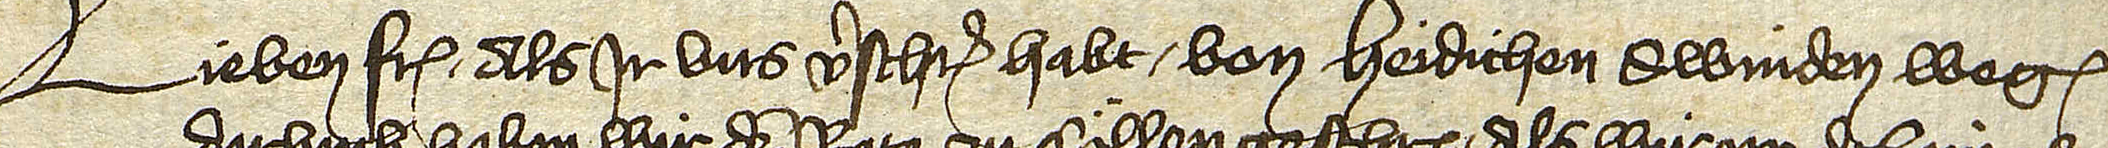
Lieben fr* / Als Ir vns v*ſchr* habt / von heidichen Swinden weg*
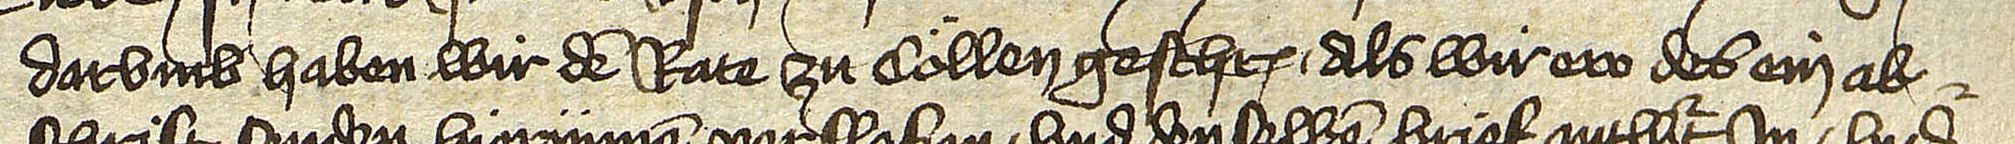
darvmb haben wir de* Rate cʒu Cöllen geſchr* / Als wir ew des ein ab =
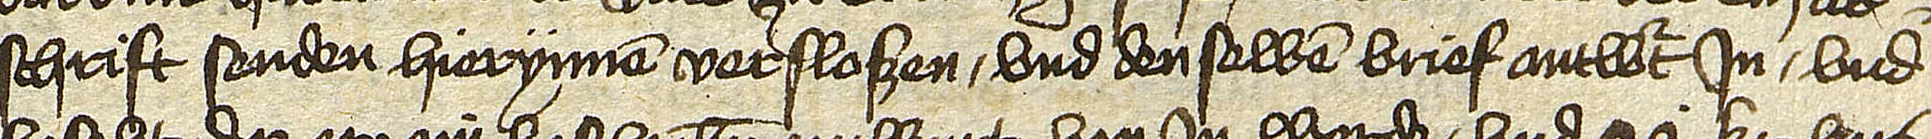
ſchrift ſenden hierynne* verſloſʒen / vnd denſelbe* brief antw*t In / vnd
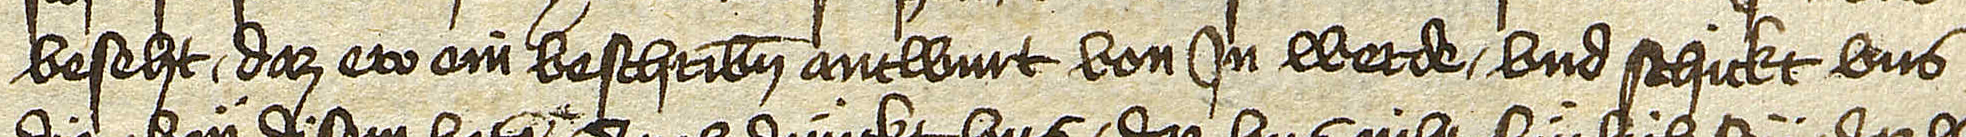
beſeht / daʒ ew ein beſchribn* antwurt von In werde / vnd ſchickt vns
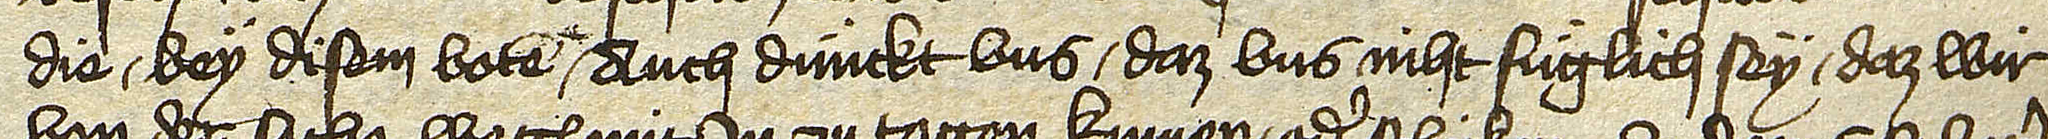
die / bey diſem bote* / Auch dünckt vns / daʒ vns niht füglich ſey / daʒ wir
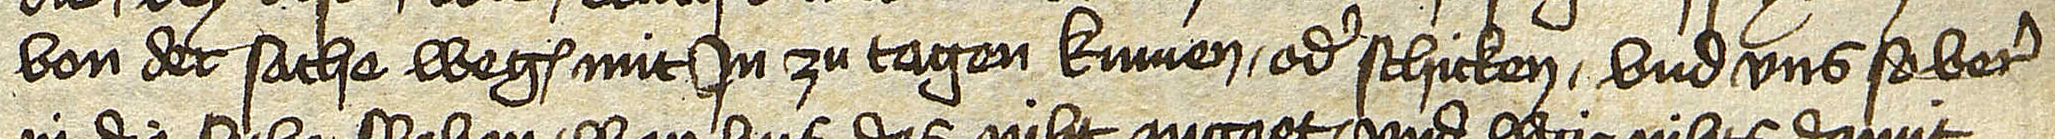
von der ſache weg* mit In cʒu tagen kumenn / od* ſchicken / vnd vns ſo ver*
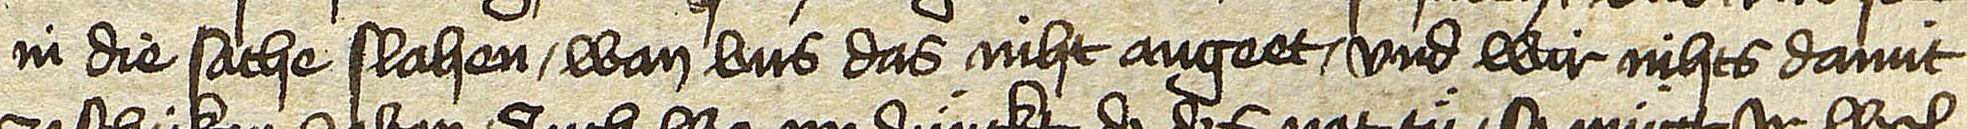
in die ſache ſlahen / wan vns das niht angeet / vnd wir nihts damit
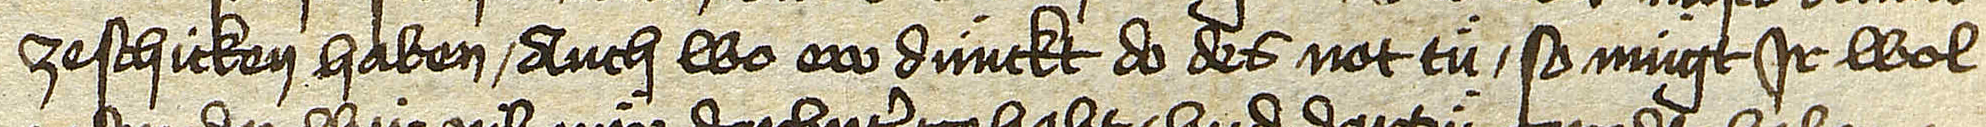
cʒeſchicken haben / Auch wo ew dünckt do des not tü / ſo mügt Ir wol
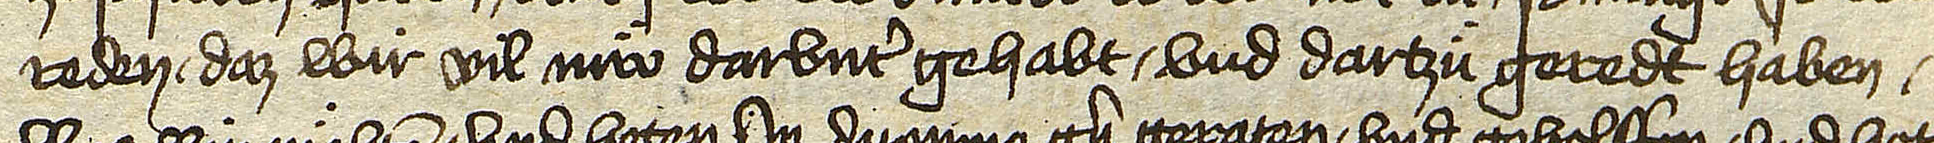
reden / daʒ wir vil mw darvnt* gehabt / vnd dartʒü geredt haben /
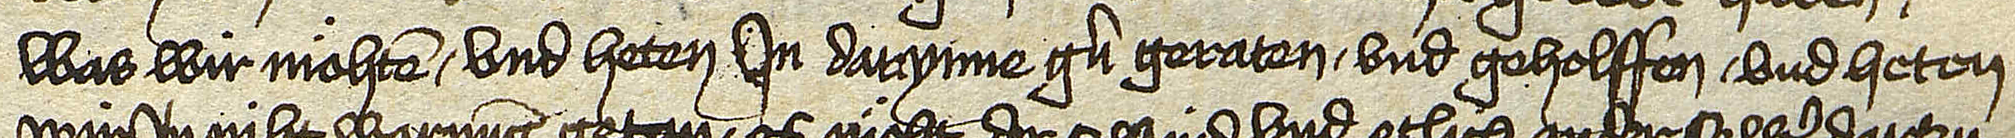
was wir möhte* / vnd heten In darynne gn* geraten / vnd geholffen / vnd heten
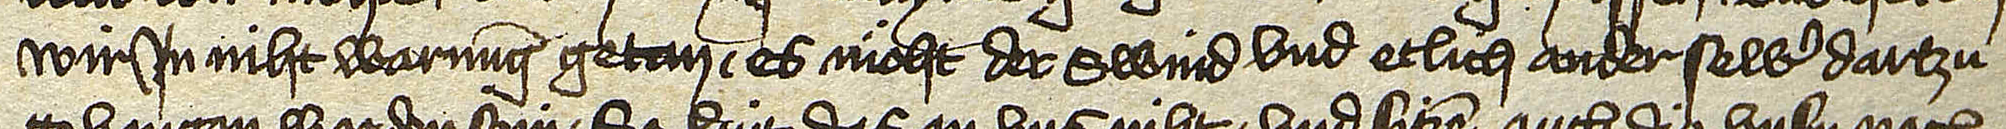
wir In niht warnug* getan / es möht der Swind vnd etlich ander ſelb* dartʒu
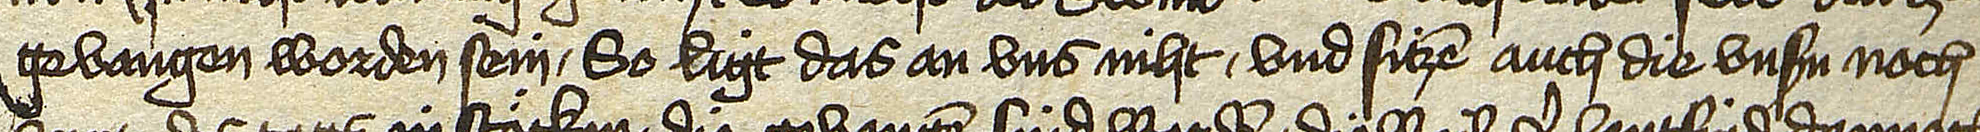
gevangen worden ſein / So ligt das an vns niht / vnd ſitʒe* auch die vnſ*n noch
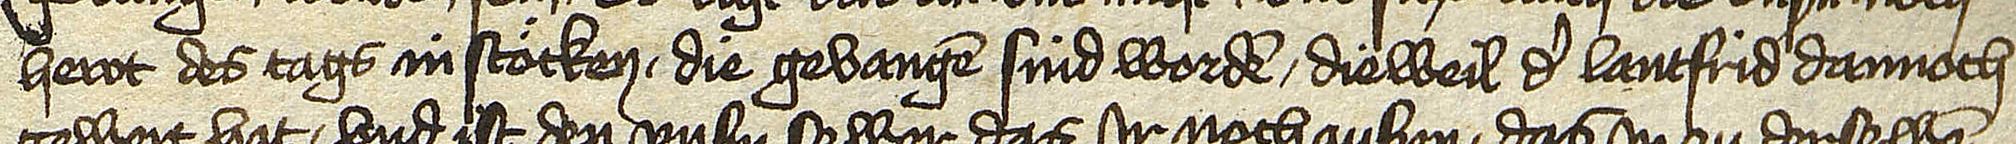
hewt des tags in ſtöcken / die gevange* ſind worde* / dieweil d* lantfrid dannoch
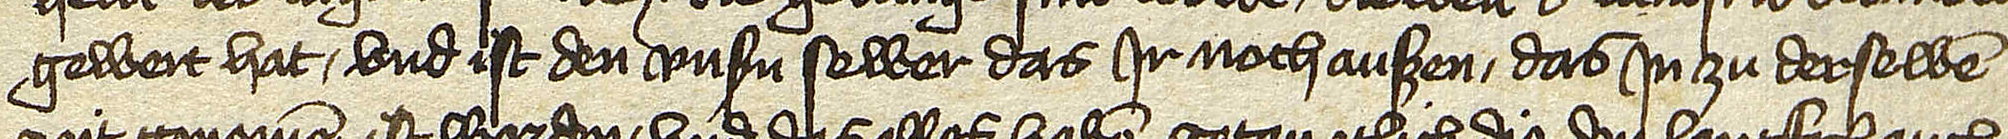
gewert hat / vnd iſt den vnſ*n ſelber das Ir noch auſʒen / das In cʒu derſelbe*
